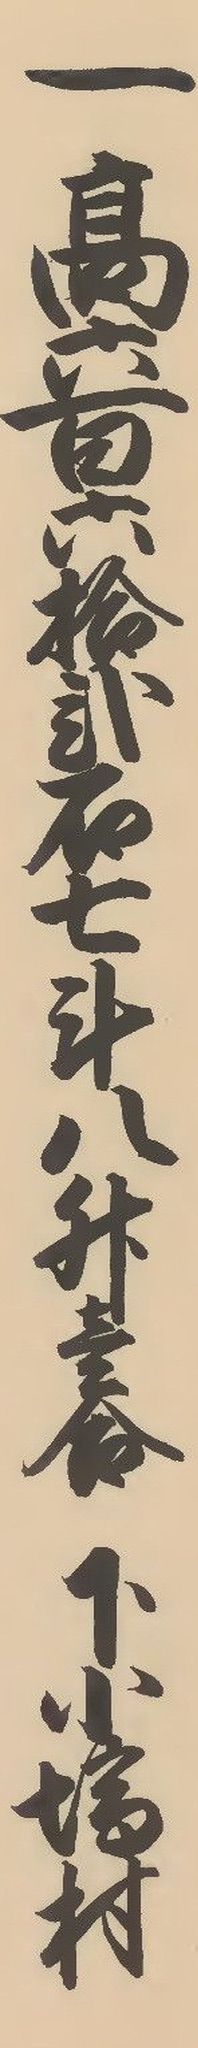一髙六百六拾弐石七斗八升壱合下小村
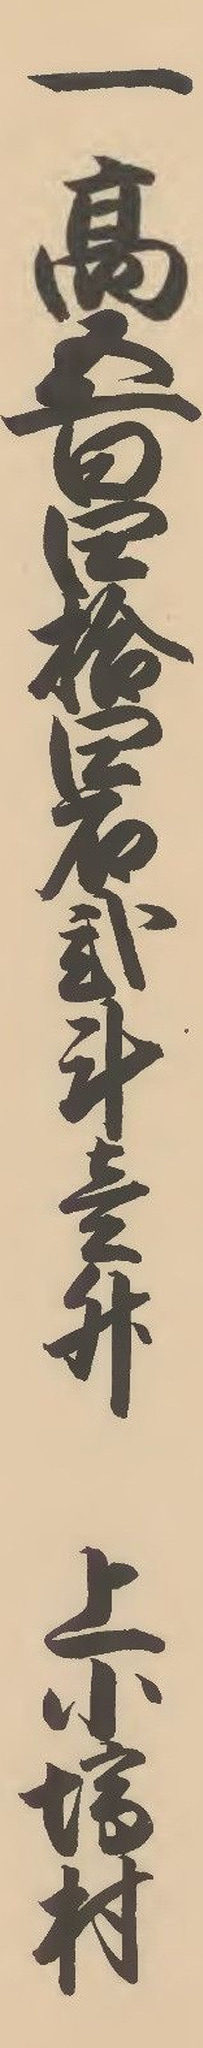一髙五百四拾四石弐斗壱升上小村
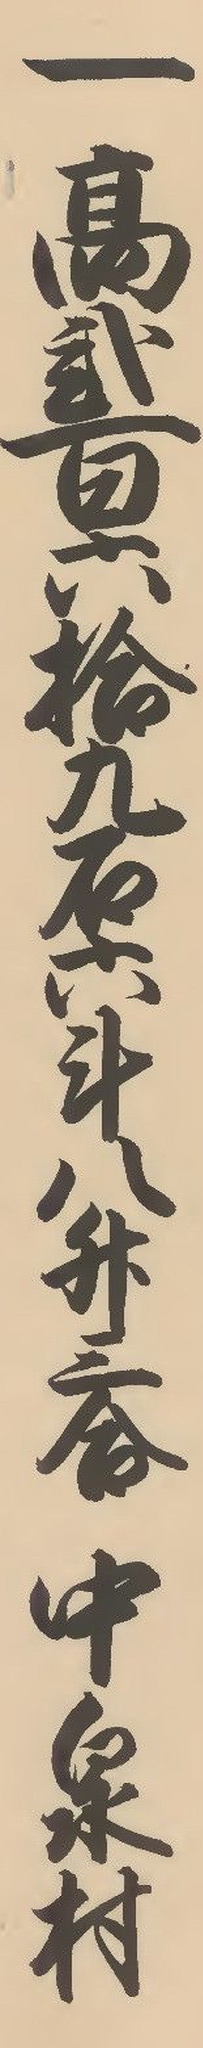一髙弐百六拾九石六斗八升三合中泉村
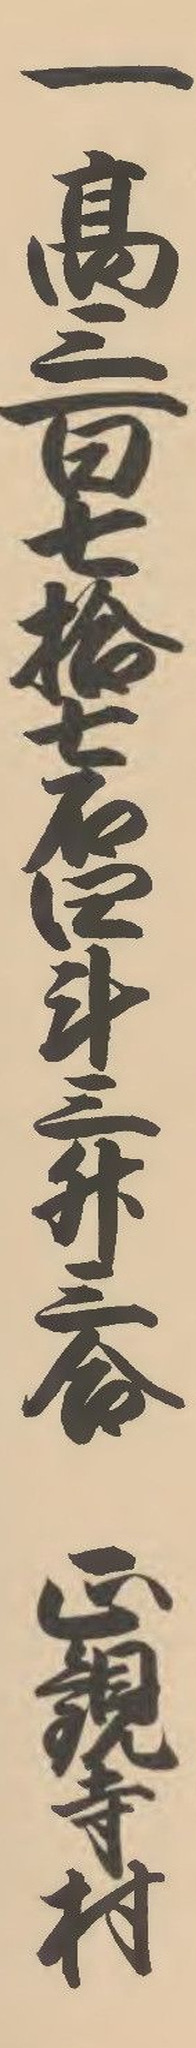一髙三百七拾七石四斗三升三合正観寺村
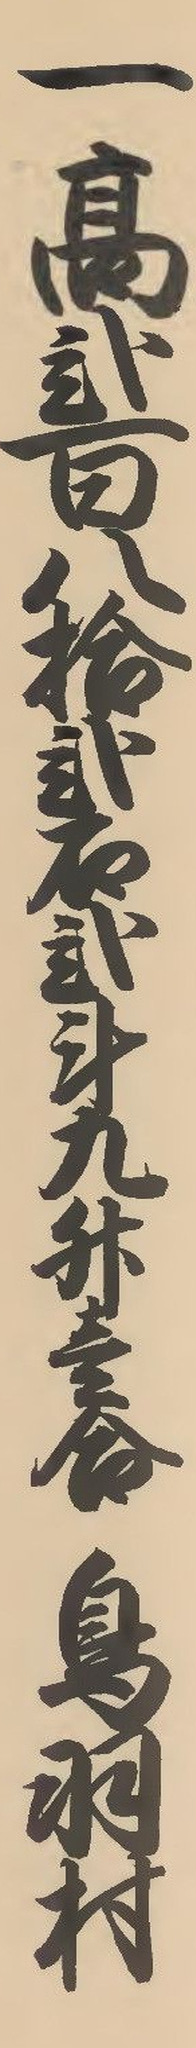一髙弐百八拾弐石弐斗九升壱合鳥羽村
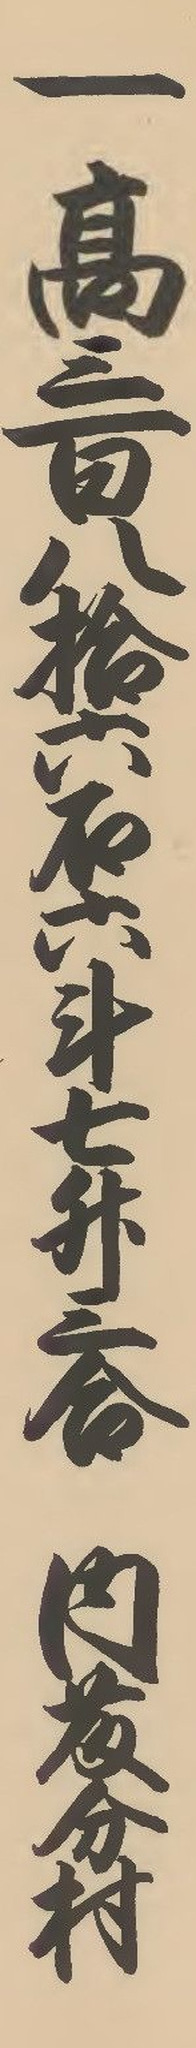一髙三百八拾六石六斗七升三合内藤分村

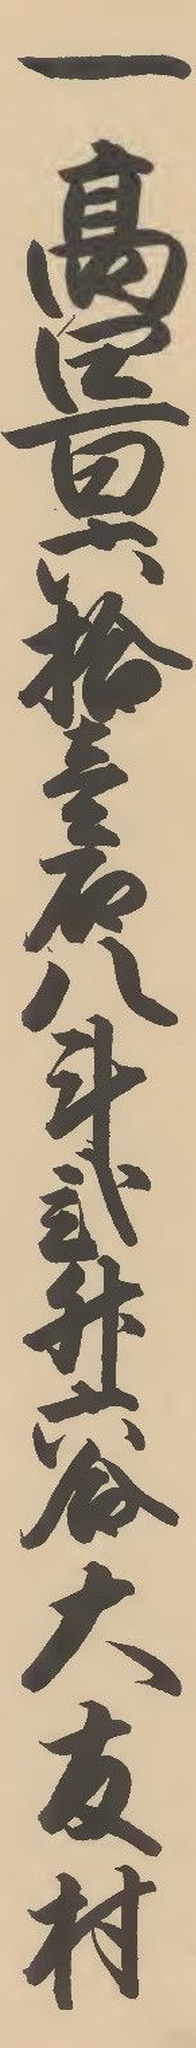一髙四百六拾壱石八斗弐升六合大友村
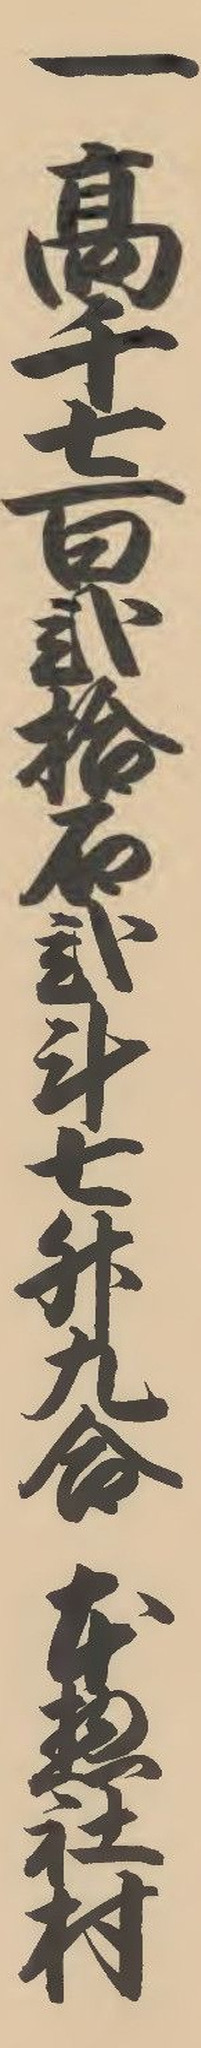一髙千七百弐拾石弐斗七升九合本惣社村
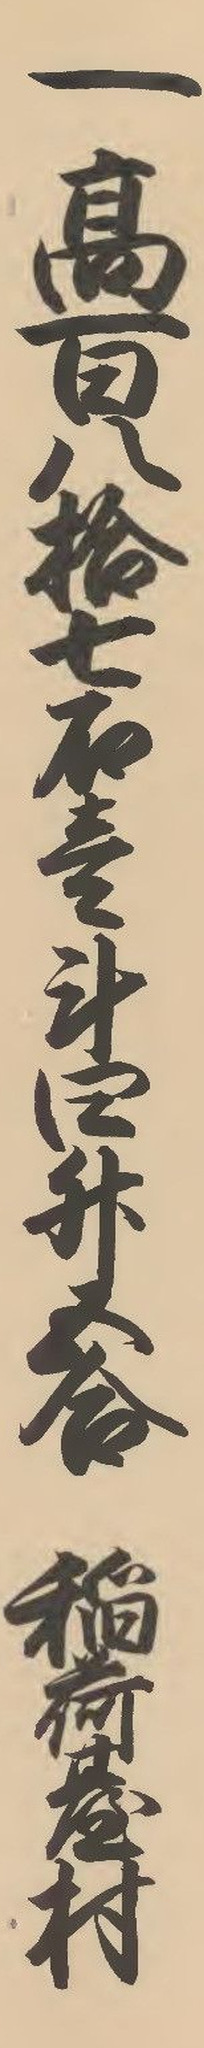一髙百八拾七石壱斗四升五合稲荷屋村
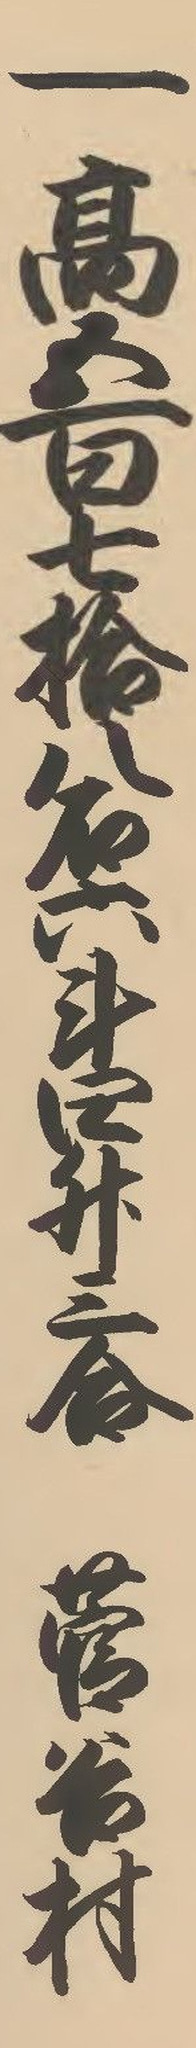一髙五百七拾八石六斗四升三合菅谷村
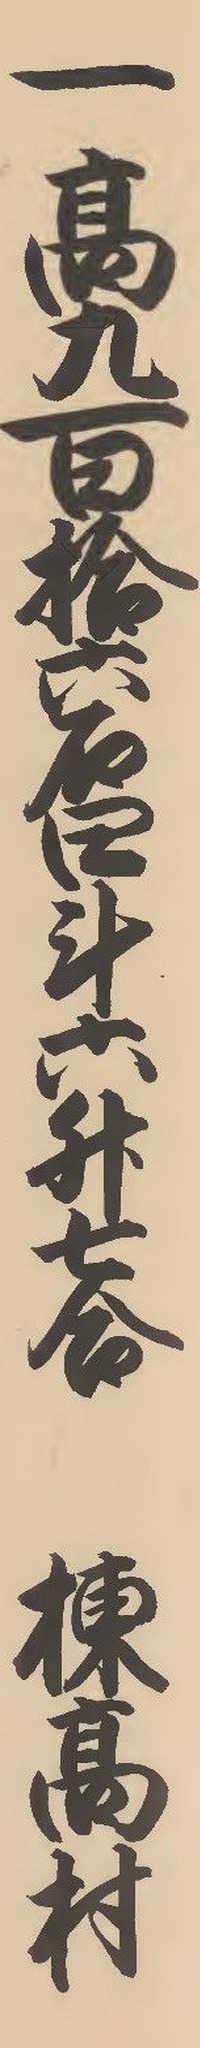一髙九百拾六石四斗六升七合棟髙村
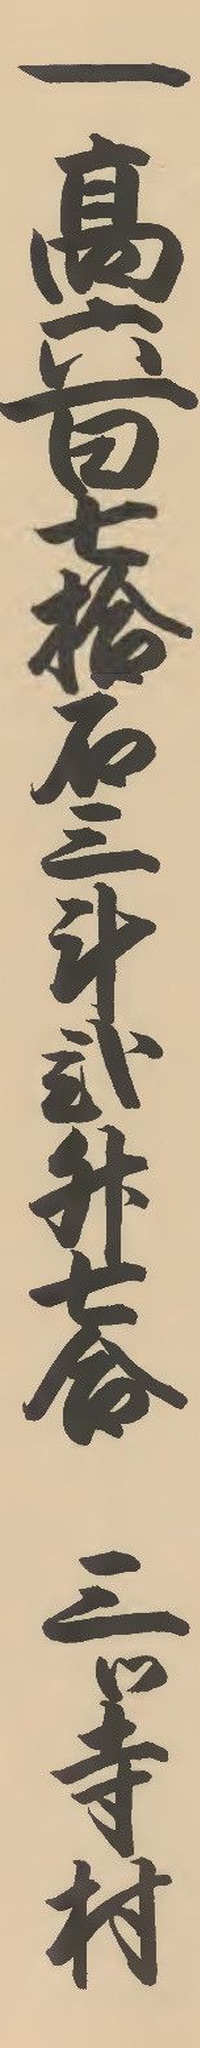一髙六百七拾石三斗弐升七合三ツ寺村
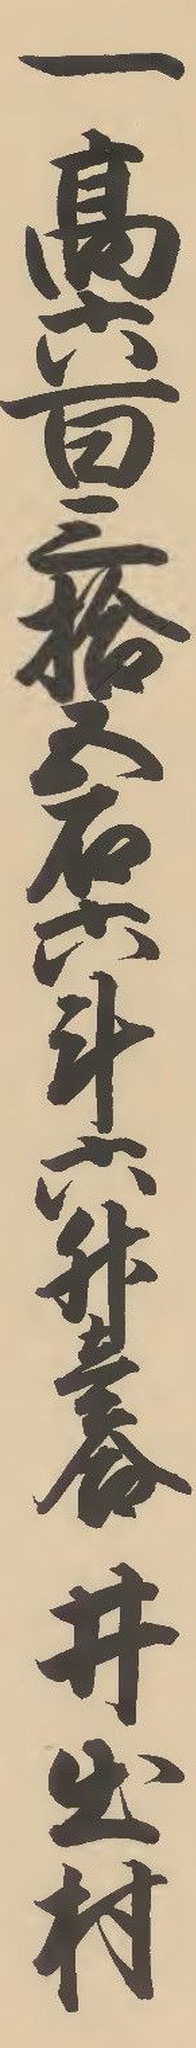一髙六百三拾五石六斗六升壱合井出村
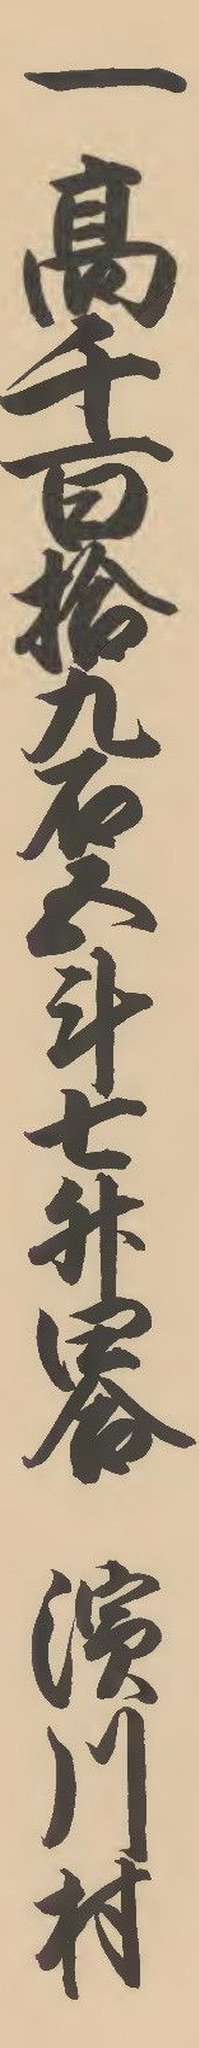一髙千拾九石五斗七升四合濱川村

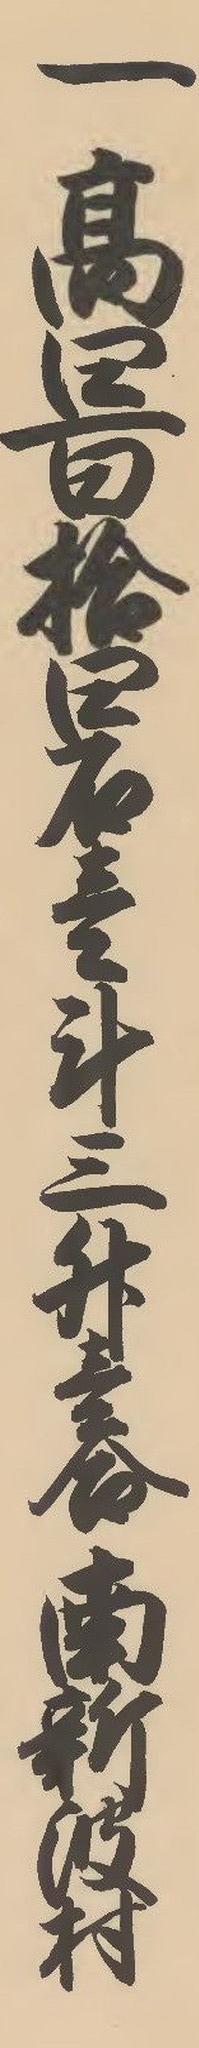一髙四百拾四石壱斗三升壱合南新波村
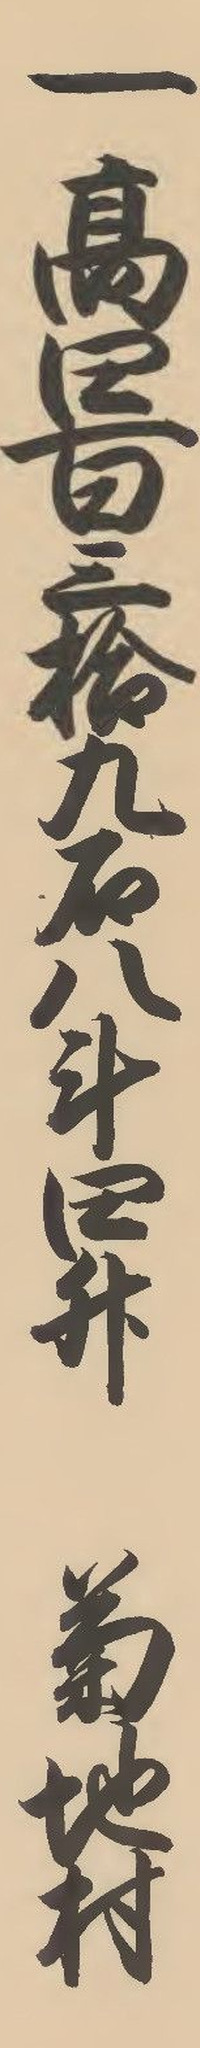一髙四百三拾九石八斗四升菊地村
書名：上野国郷帳
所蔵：国立公文書館 National Archives of Japan
